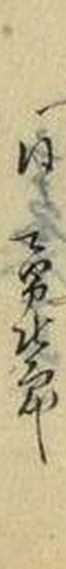同勇次郎

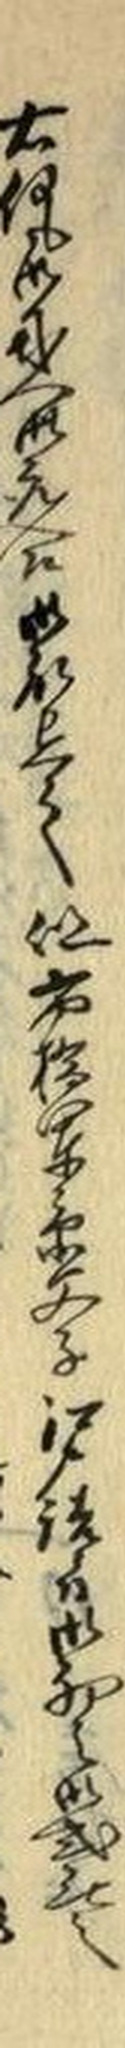右何も御用人御取合御礼申上之但市橋軍兵衛父子江戸詰ニ付御初之御式無之
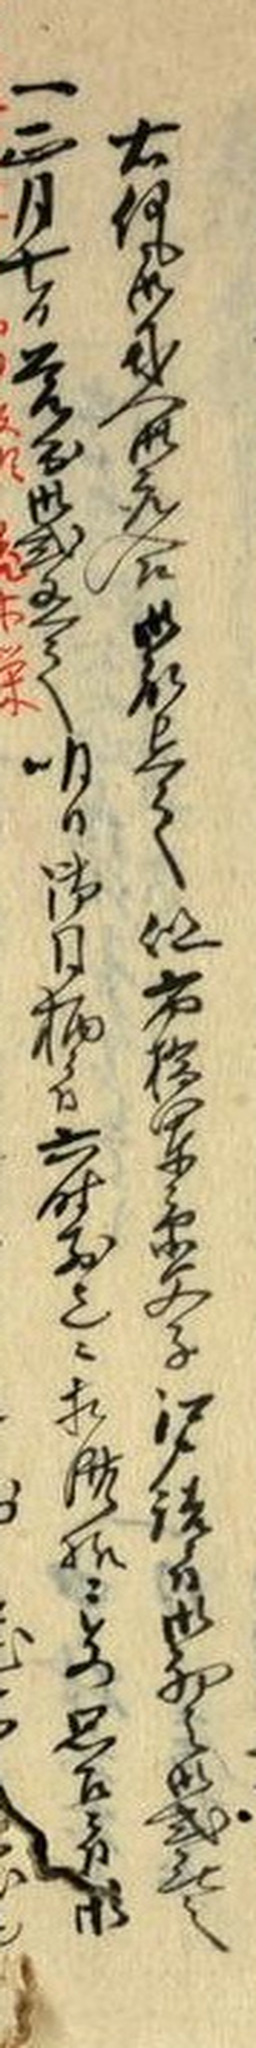一正月七日節分御式有之明日御日柄ニ付六時前迄二相済候様との思召ニ付御
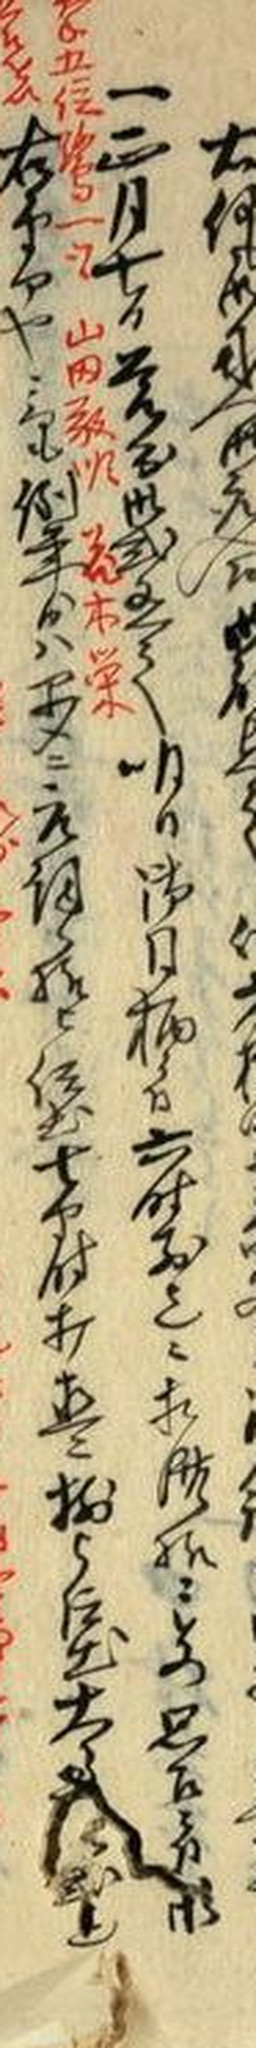右筆部やニ而も例年ゟハ早メニ取調候様被仰出七半時打直ニ揃被仰出大奥
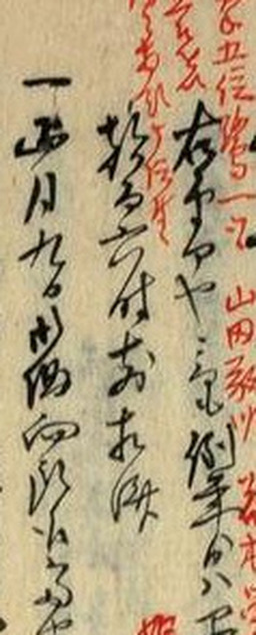都而六時前相済
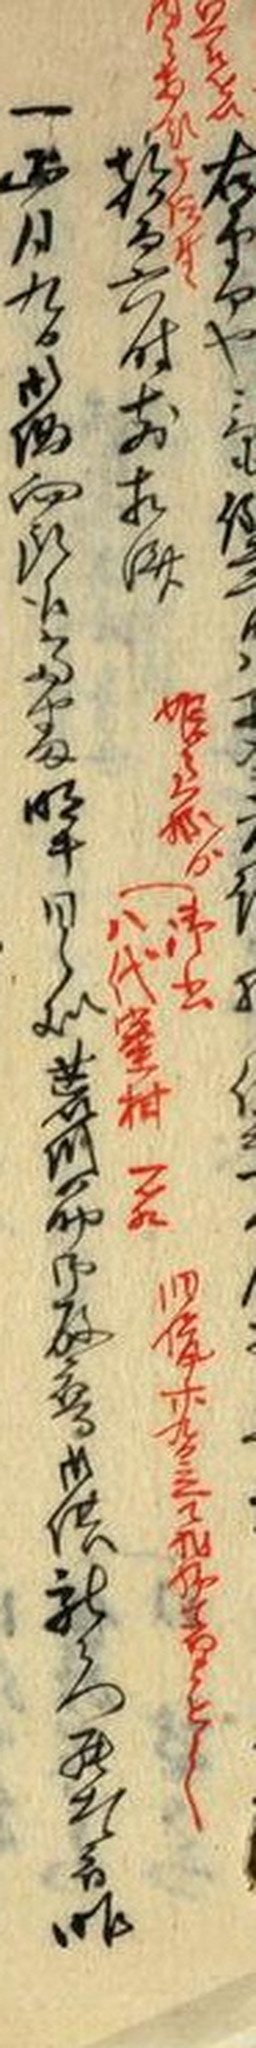一正月九日御側向頭取当番明キ日之処荒川筋御放鷹御供新右衛門罷出候ニ付昨
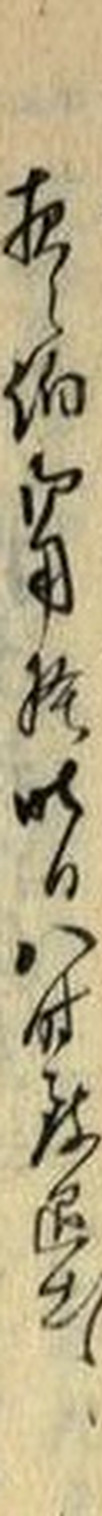夜之泊御用捨昨日八時致退出候
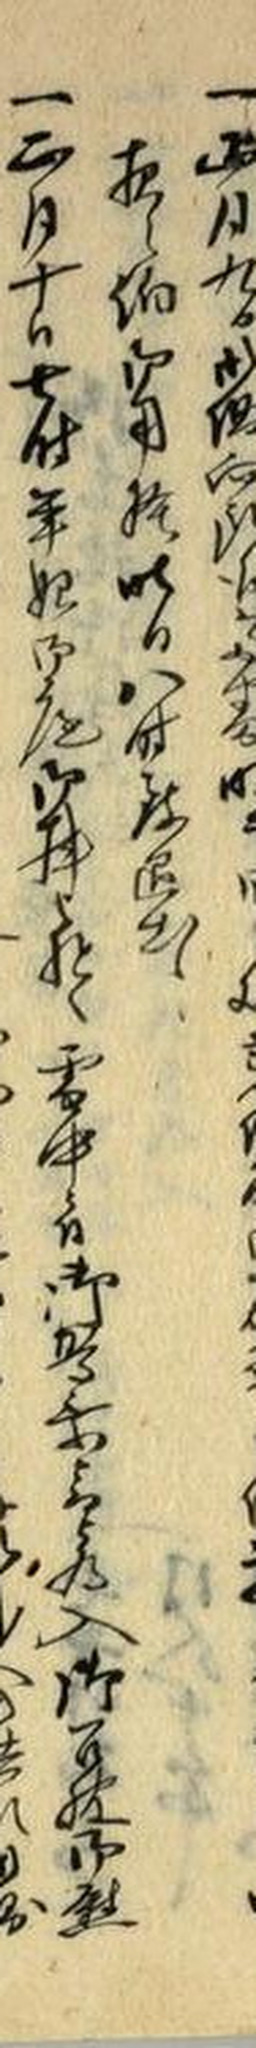一正月十日七時年始御庭御拝被遊候雪中ニ付御駕乗ニ而被為入御召服御熨
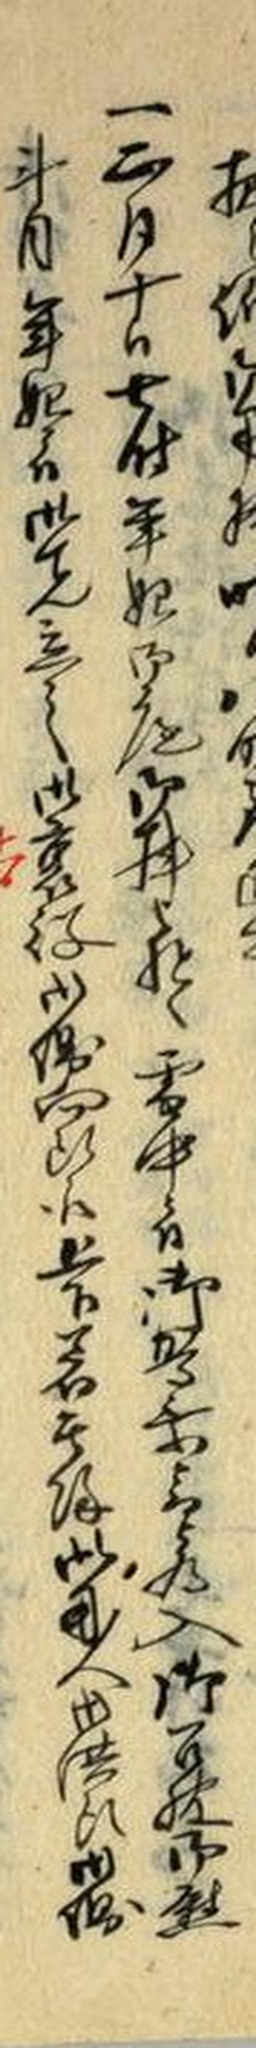斗目年始ニ付御先立之御裏役御側向頭取上下着其餘御用人御供頭御側
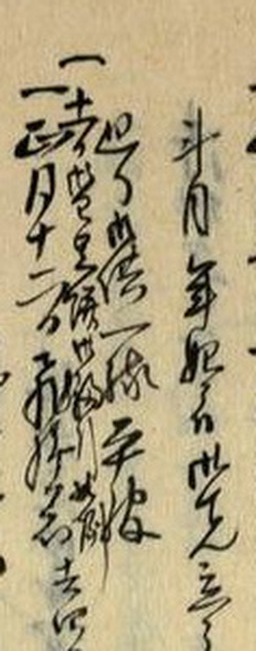廻り御供一統平服
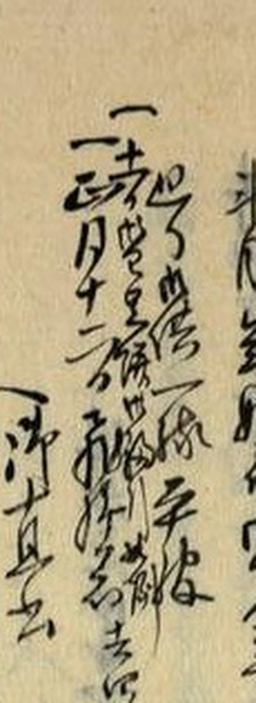一十一日御具足餅御福引如例
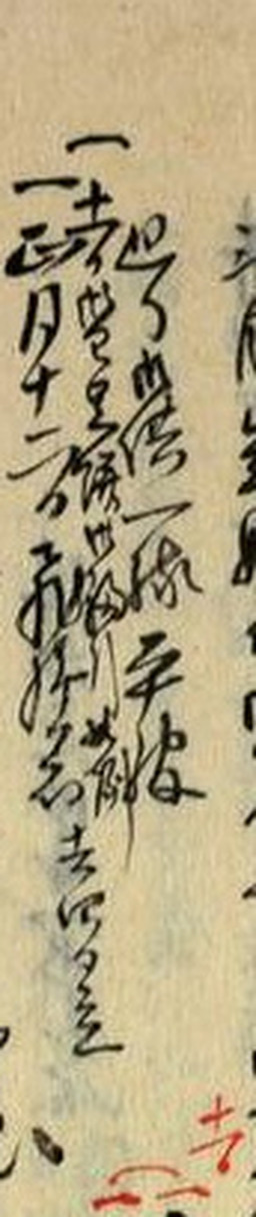一正月十二日飛脚着去四日立
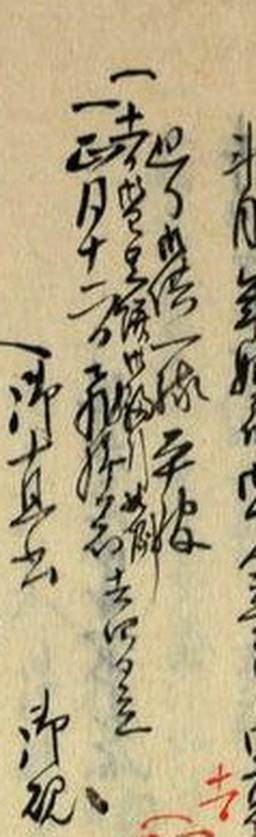一正月十二日飛脚着去四日立
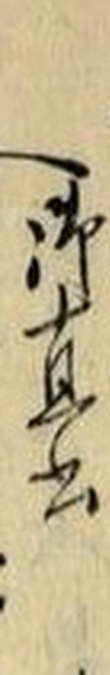御直書
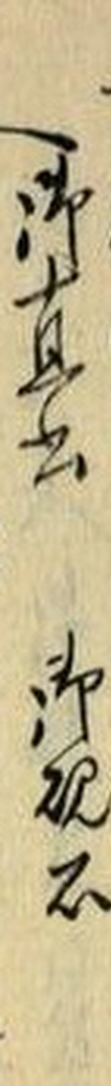御直書御硯石
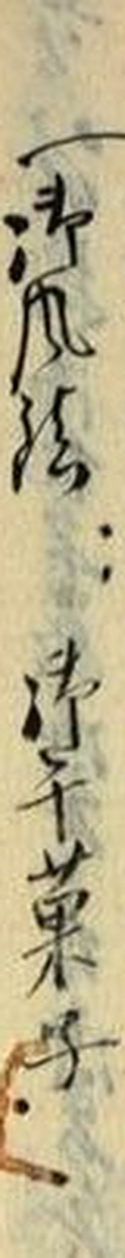御風鎮御干菓子
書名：少傅日録抄（斉承付側向頭取日記、在国）
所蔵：福井県文書館 Fukui Prefectural Archives
